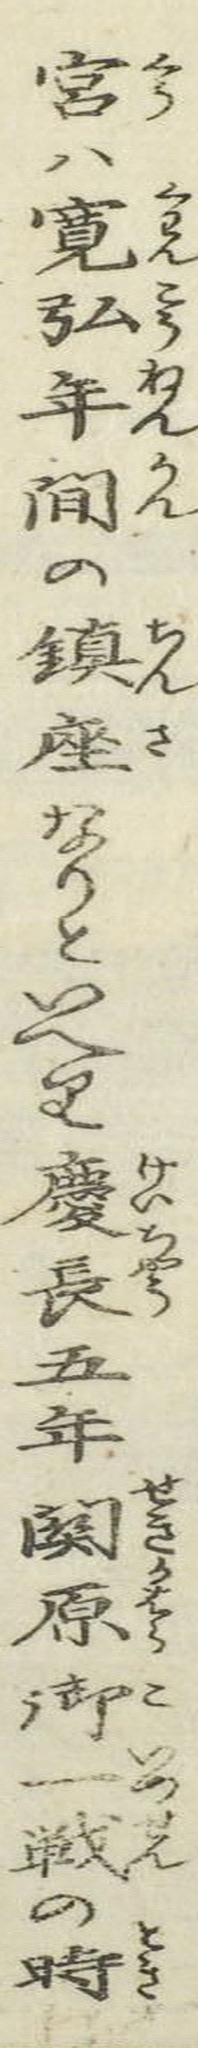宮は寛弘年間の鎮座なりといへり慶長五年関原御一戦の時
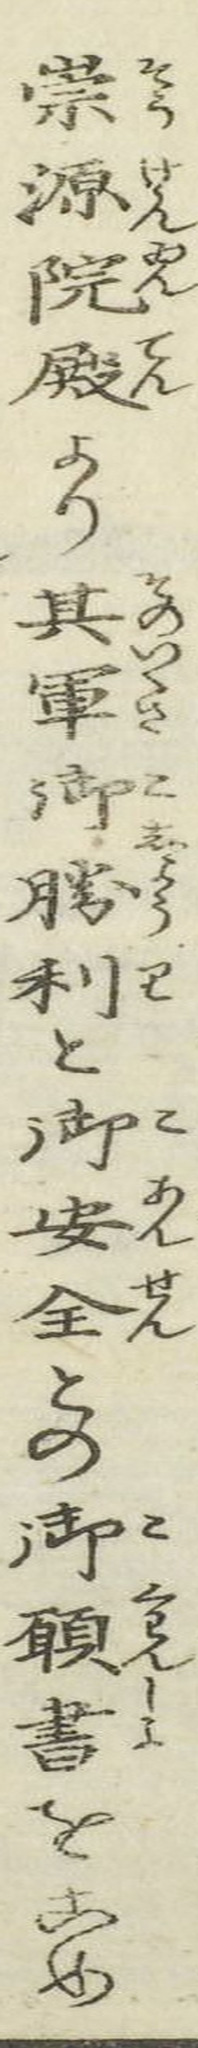崇源院殿より其軍御勝利と御安全との御願書をこめ
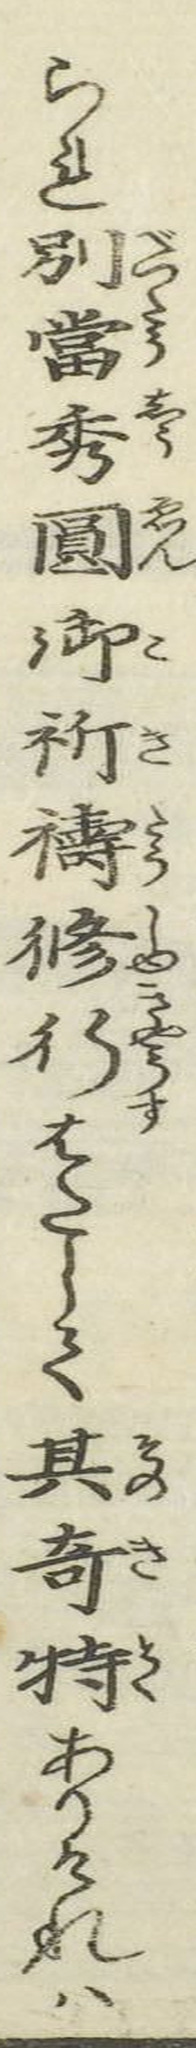られ別當秀圓御祈禱修行はたして其奇特ありけれは
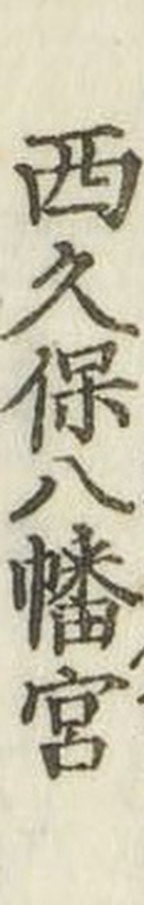西久保八幡宮

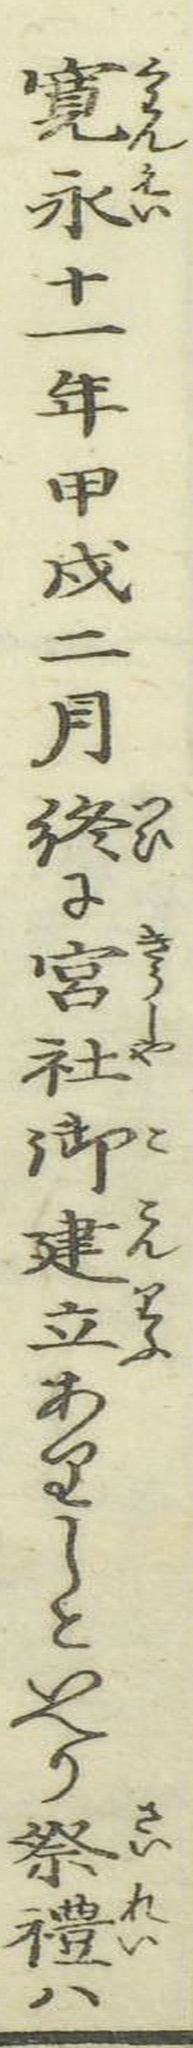寛永十一年甲戌二月終に宮社御建立ありしといへり祭禮は
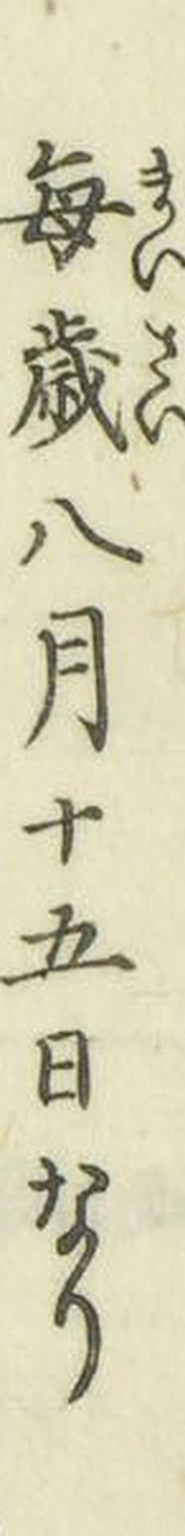毎歳八月十五日なり
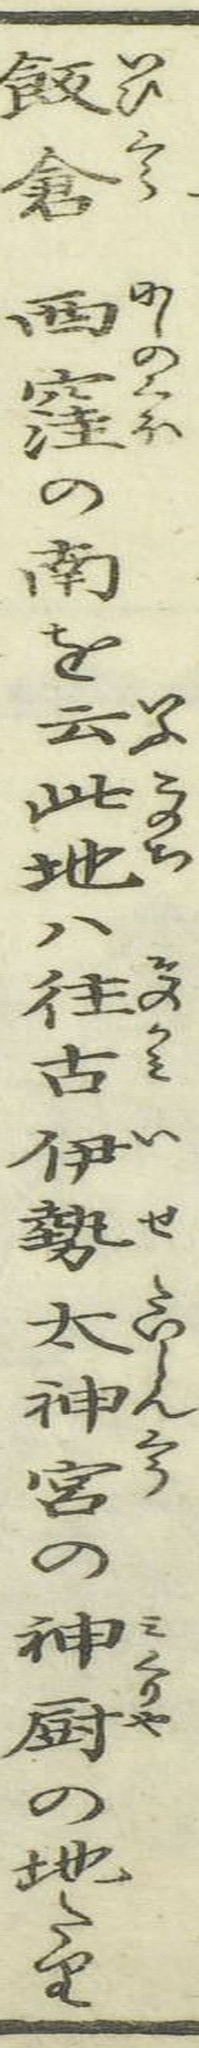飯倉西窪の南を云此地は往古伊勢太神宮の神厨の地たり
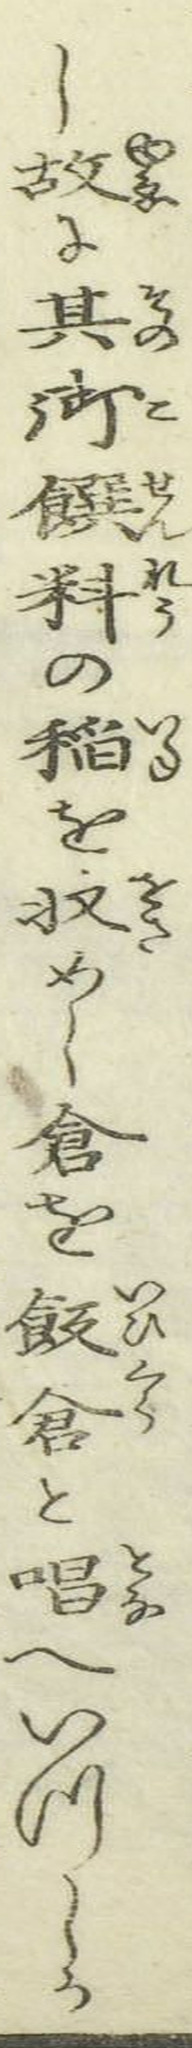し故に其御饌料の稲を収めし倉を飯倉と唱へいつしか
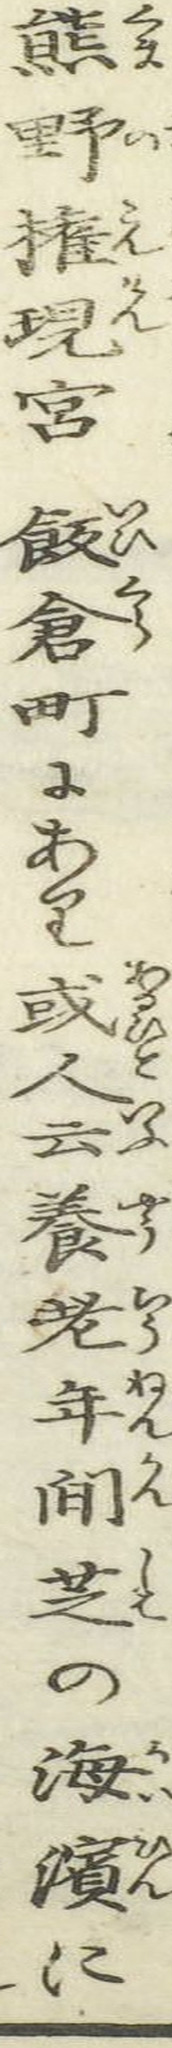熊野権現宮飯倉町にあり或人云養老年間芝の海濱に
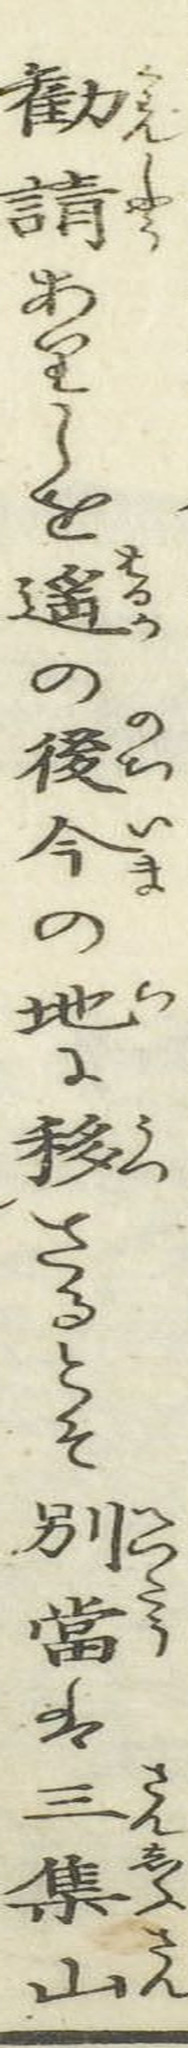勧請ありしを遥の後今の地に移さるとそ別當は三集山
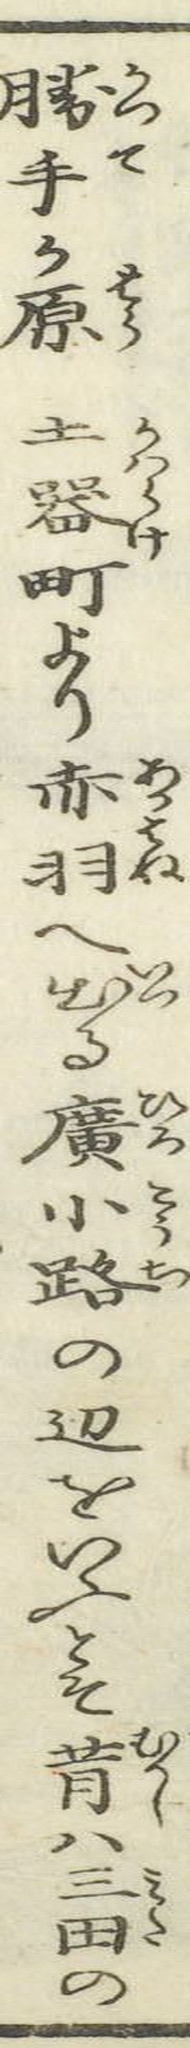勝手ゕ原土器町より赤羽へ出る廣小路の辺をいふとそ昔は三田の
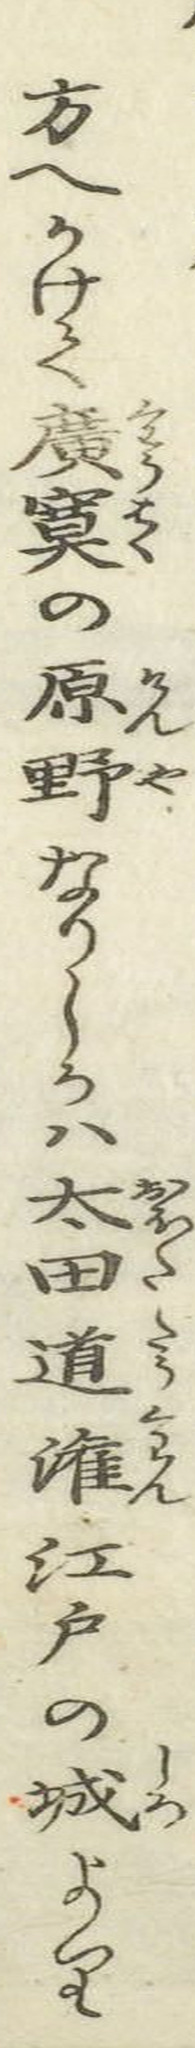方へかけて廣寞の原野なりしかは太田道灌江戸の城より
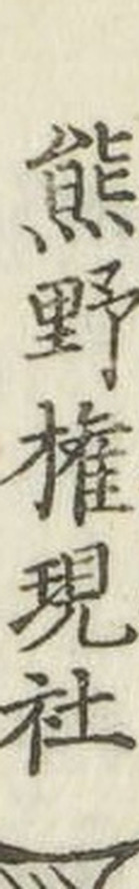熊野権現社

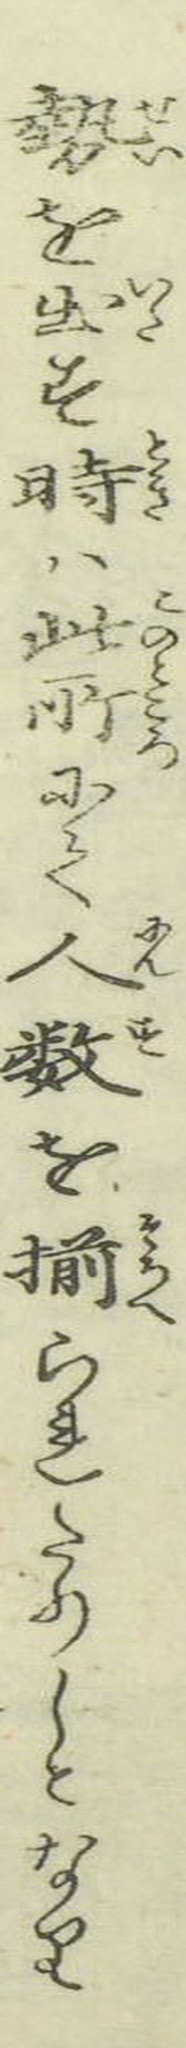勢を出す時は此所にて人数を揃られたりしとなり
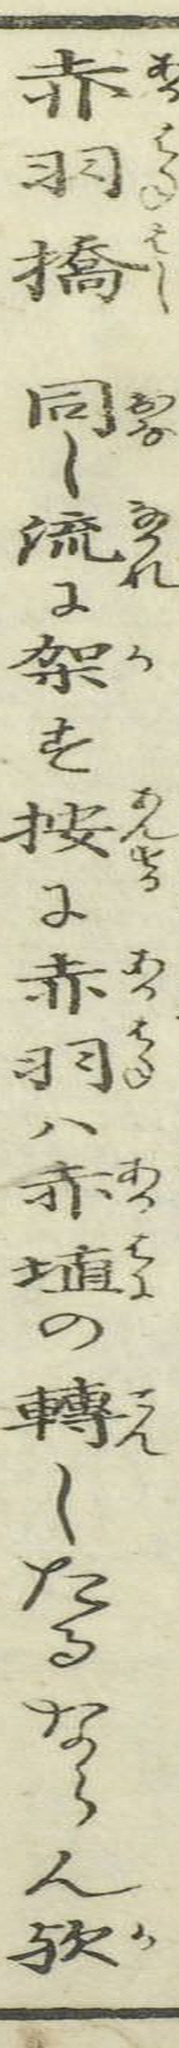赤羽橋同し流に架す按に赤羽は赤埴の轉したるならん歟
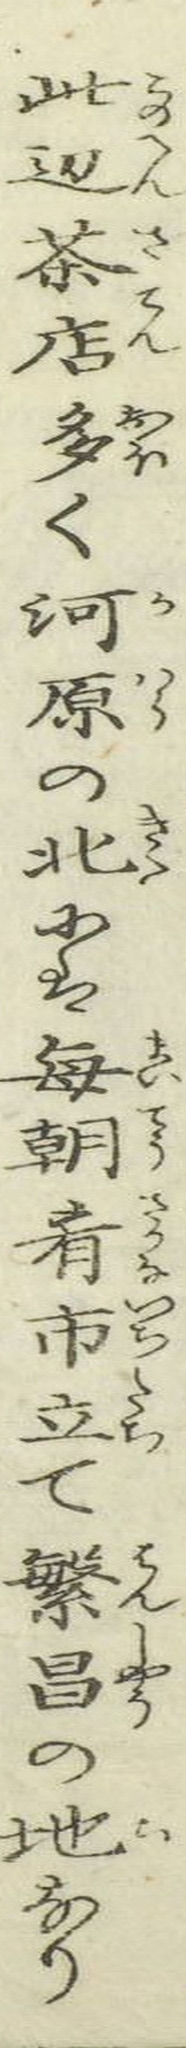此辺茶店多く河原の北には毎朝肴市立て繁昌の地なり
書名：江戸名所図会 20巻 巻之3
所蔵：東京学芸大学教育コンテンツアーカイブ
